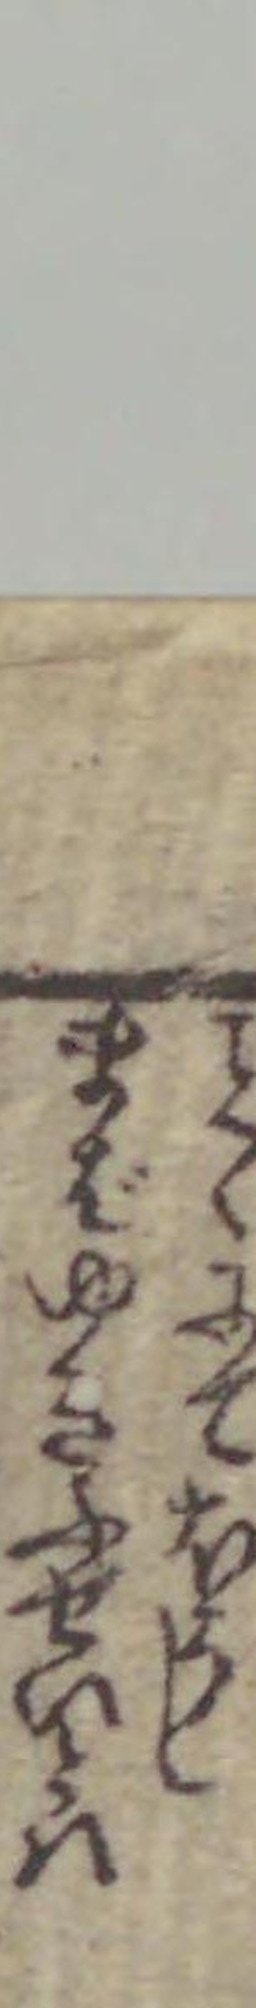まばゆきふせいとハ
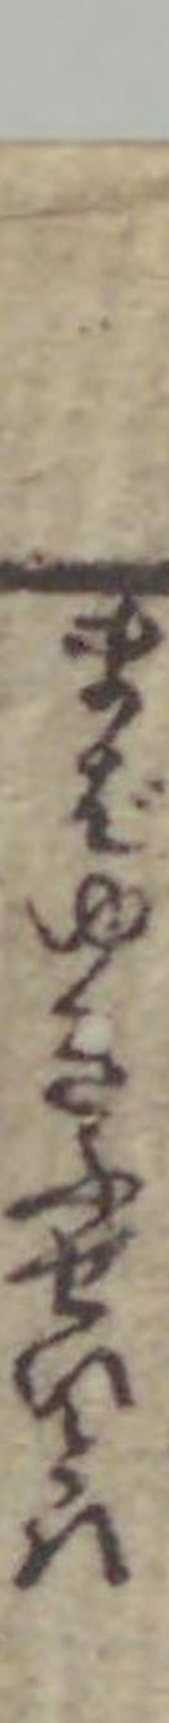まばゆきふせいとハ
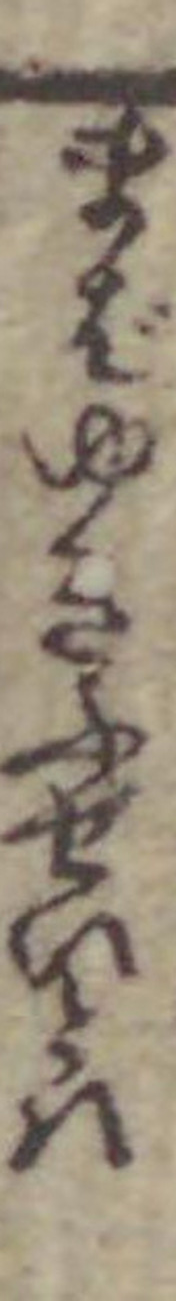まばゆきふせいとハ
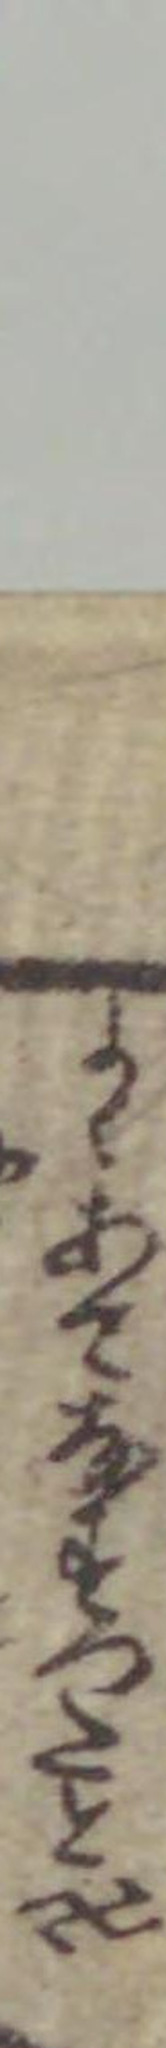よくあてなすつたと
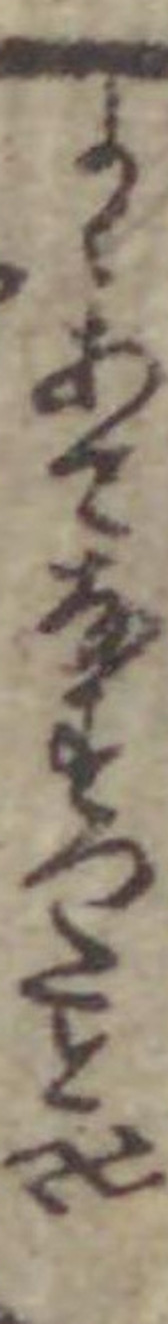よくあてなすつたと
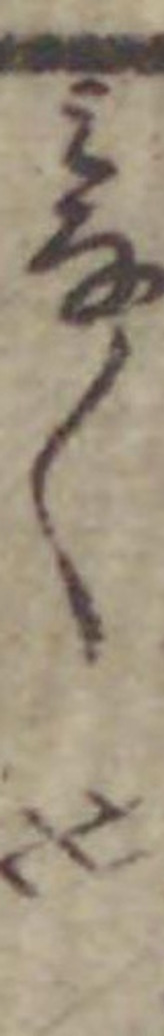ミな〳〵
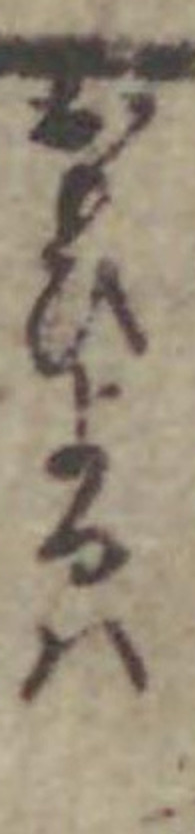おもひよるハ
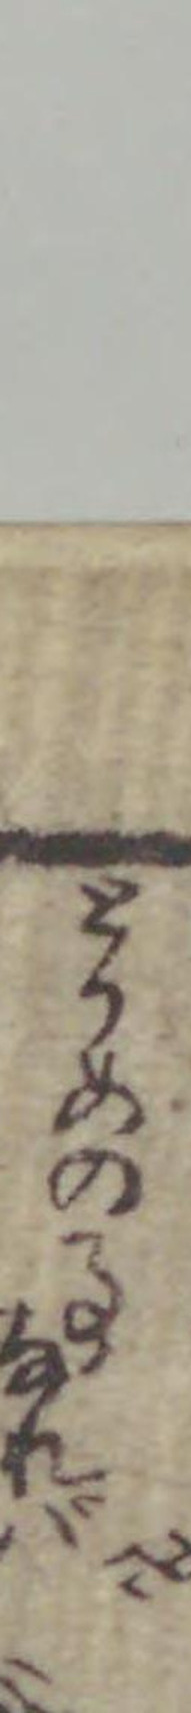とりめの事なれバ
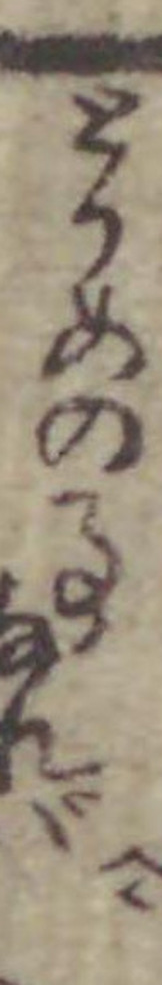とりめの事なれバ
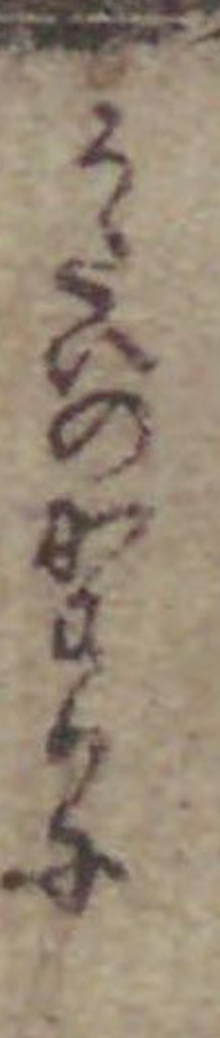うたいのかわりに
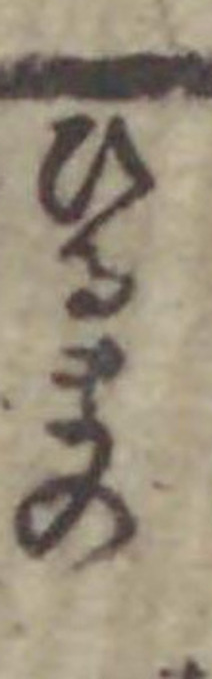ひるまの
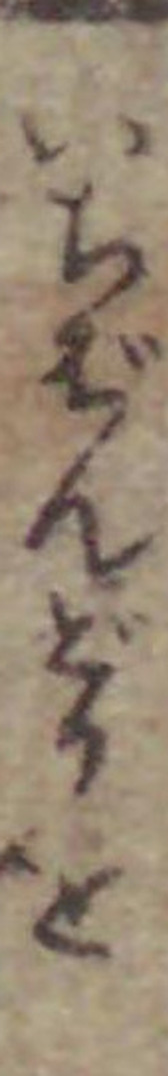いちばんどりを
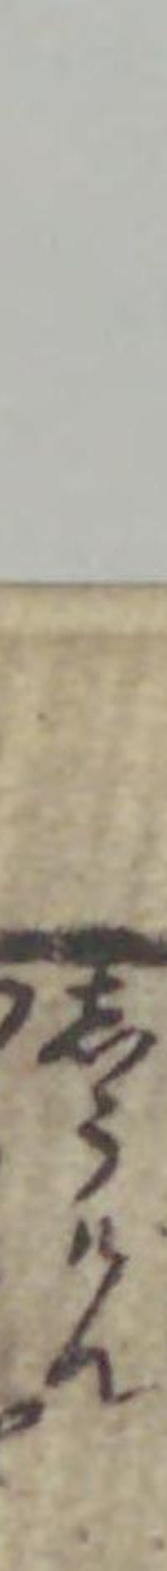しうけん
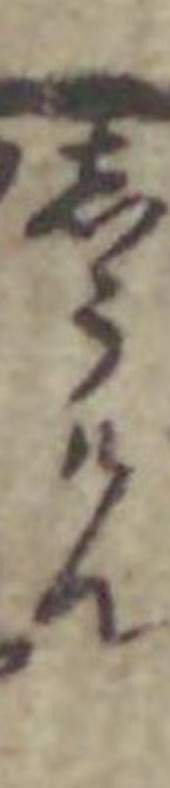しうけん
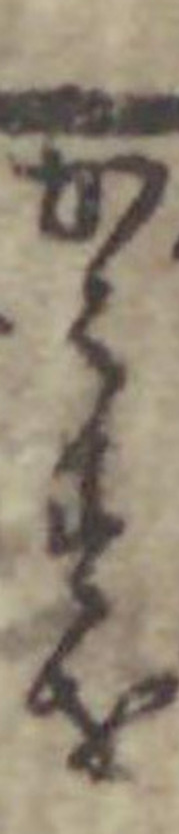かくすを
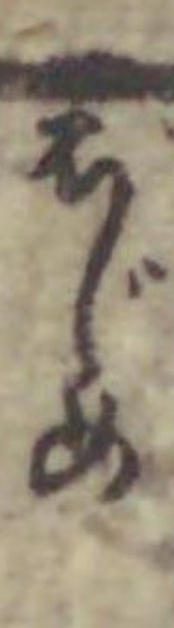はじめ
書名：烏行水諺草 3巻
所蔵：国立国会図書館 National Diet Library, JAPAN
